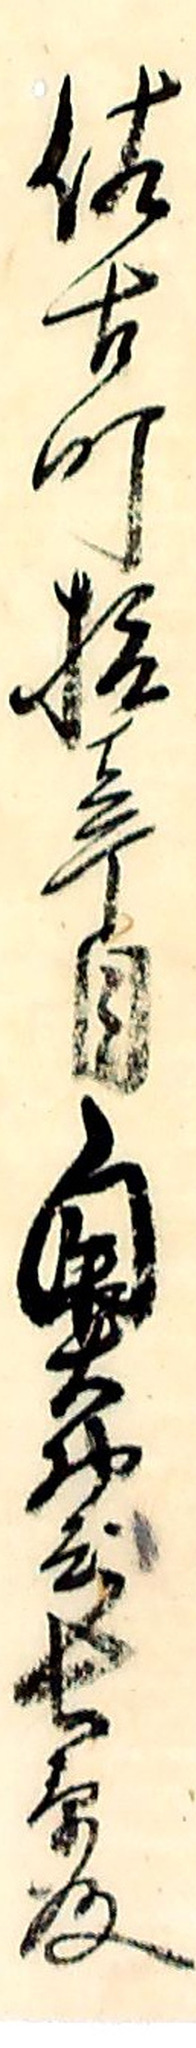佐古町拾壱丁目奥野屋長兵衛殿
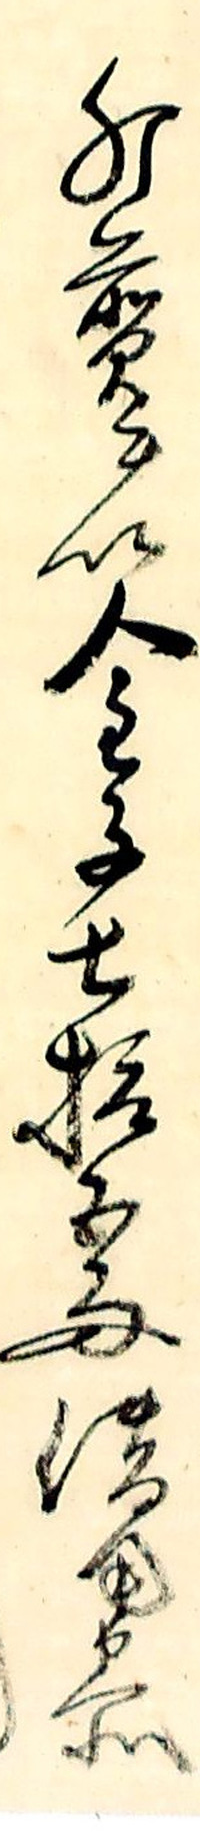肝煎を以金子七拾五両借用申所
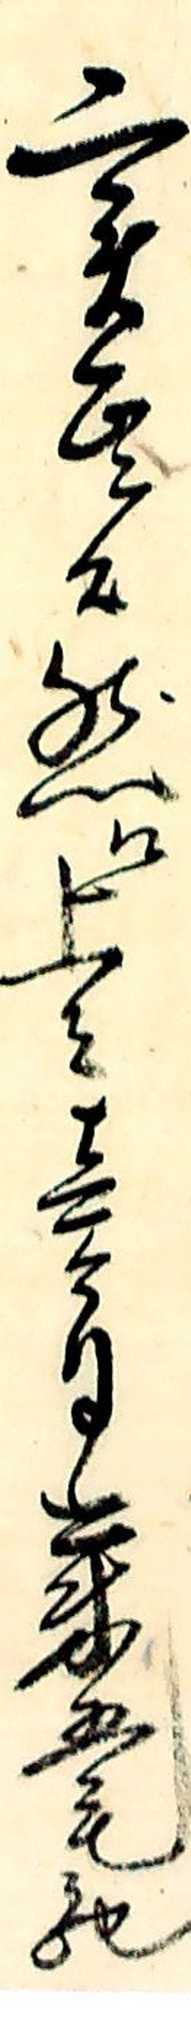実正に候然る上は壱ヶ月二朱五毛宛
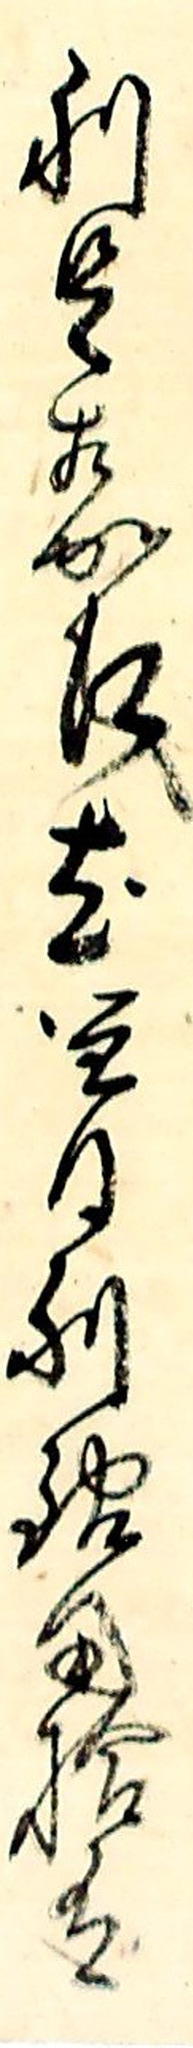利足相加え尤閏月利銀用捨有
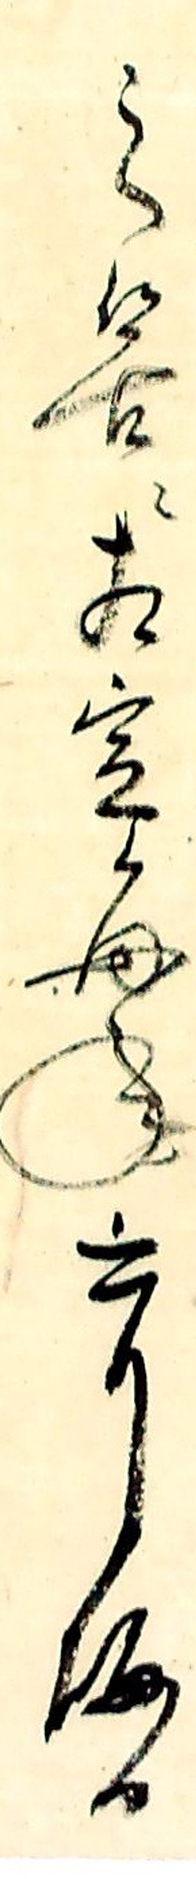之筈に相定毎年六月晦日
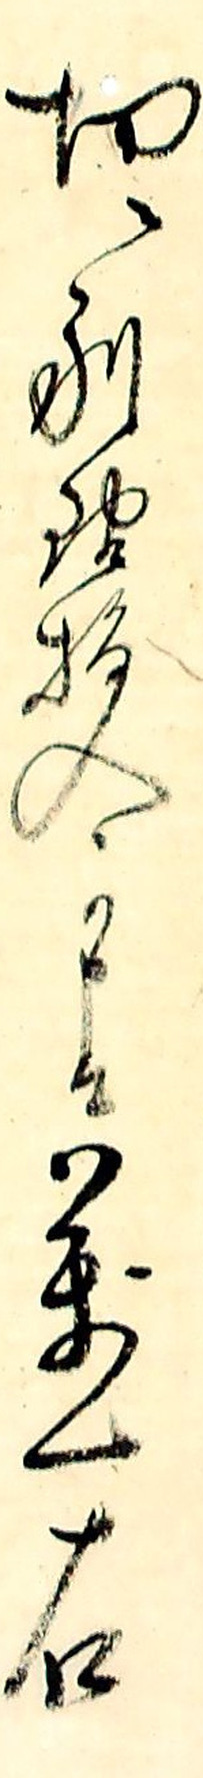切に利銀指入可申候万一右
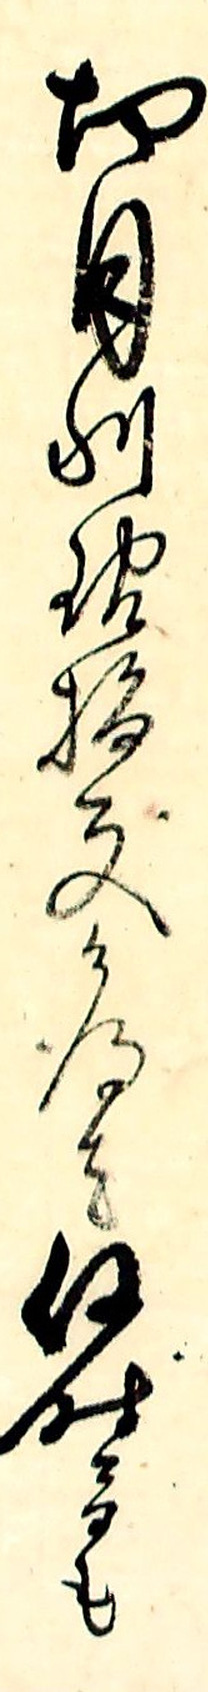切月利銀指支候得は何時にても
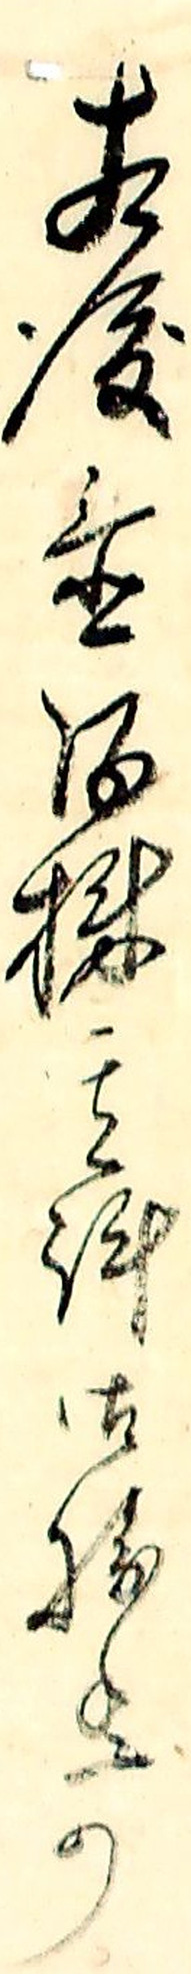相渡置酒株其許御勝手に可
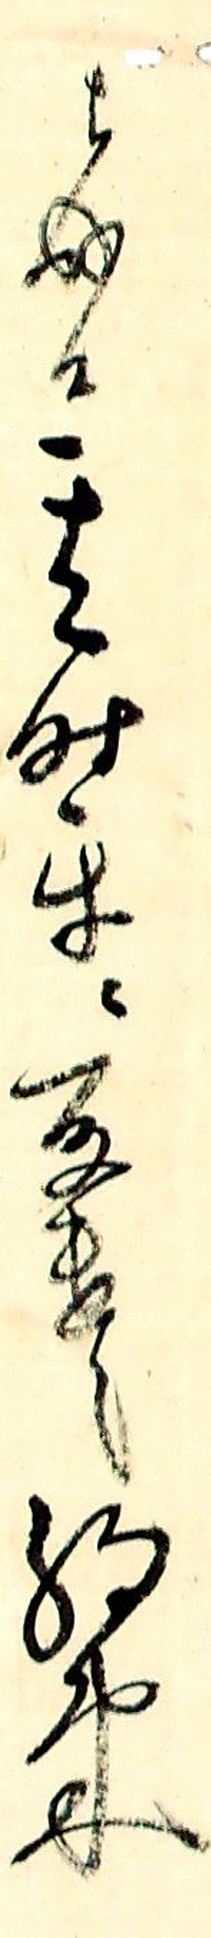被成候其時互に取遣之約束
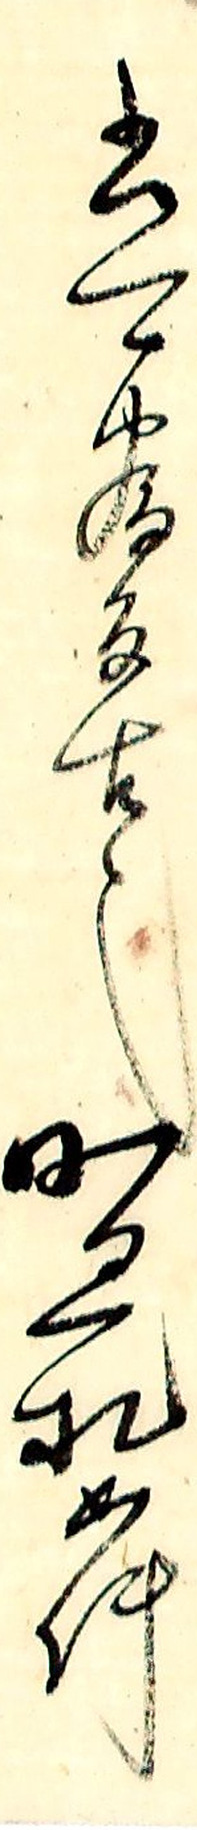書可為反古也仍て一札如件
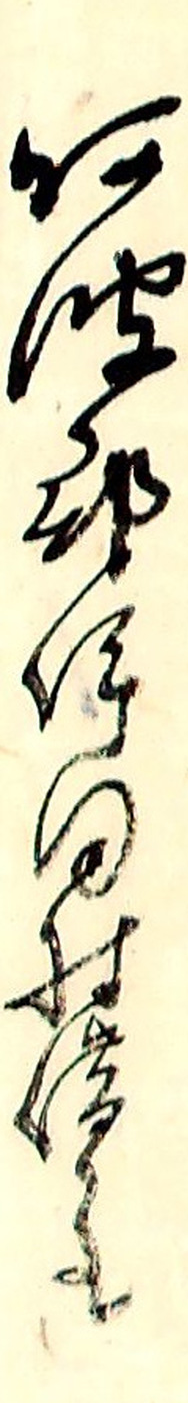阿波郡伊月村借り主
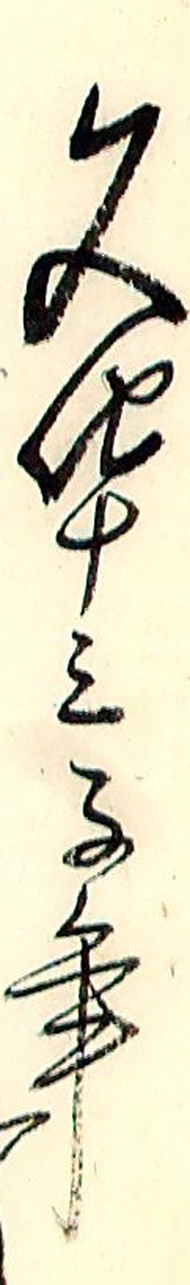文化十三子年

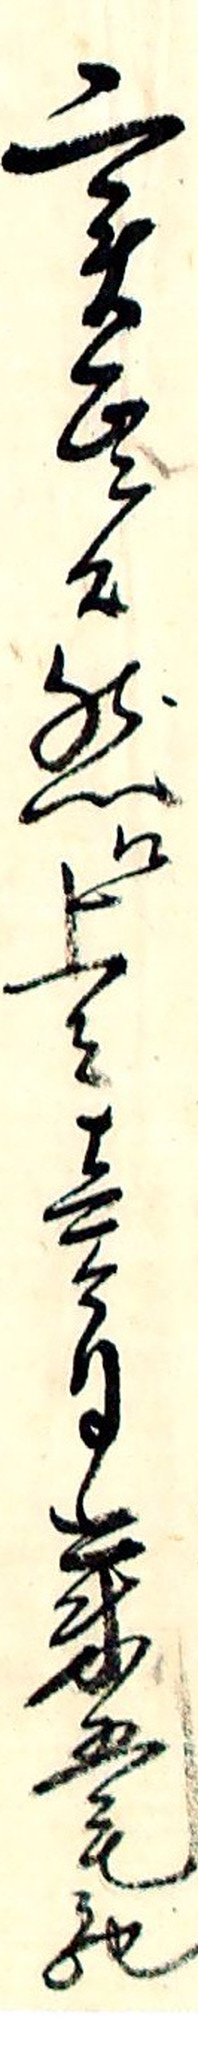実正に候然る上は壱ヶ月二朱五毛宛
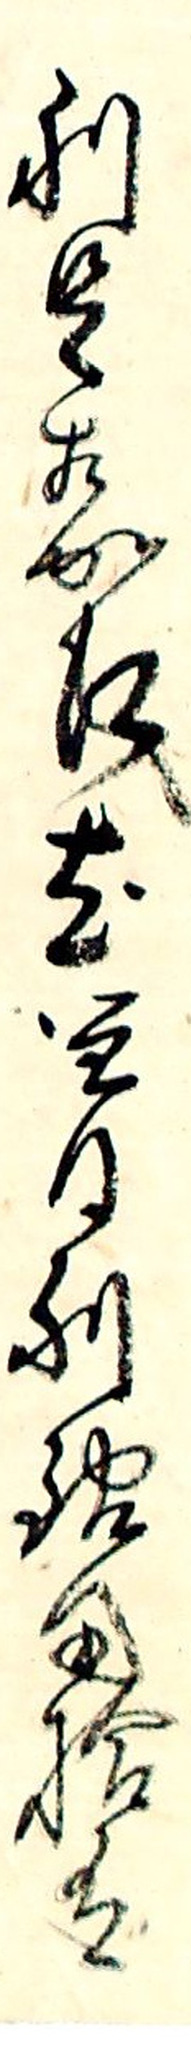利足相加え尤閏月利銀用捨有
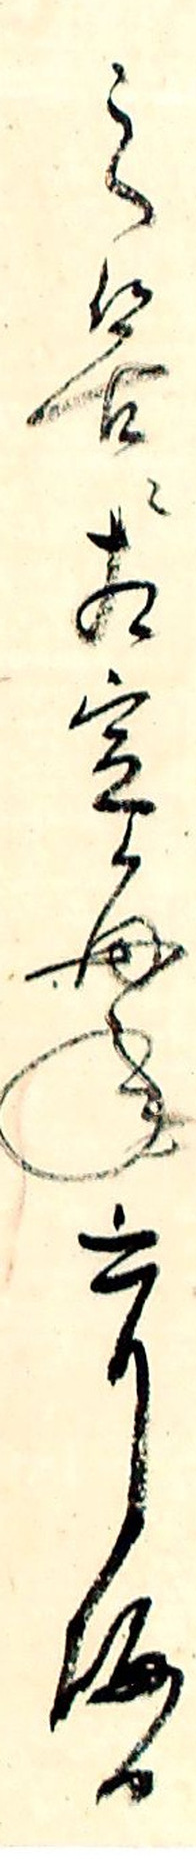之筈に相定毎年六月晦日
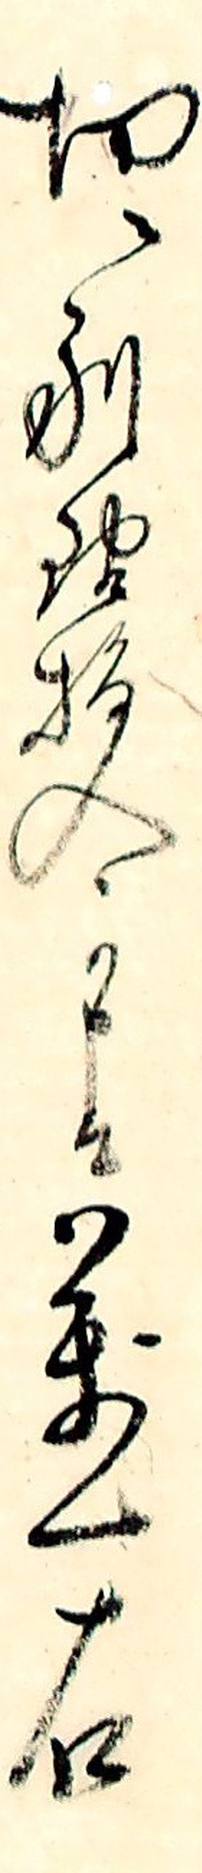切に利銀指入可申候万一右
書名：諸御願書控(後藤氏壱番）
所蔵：鳴門教育大学 Naruto University of Education
